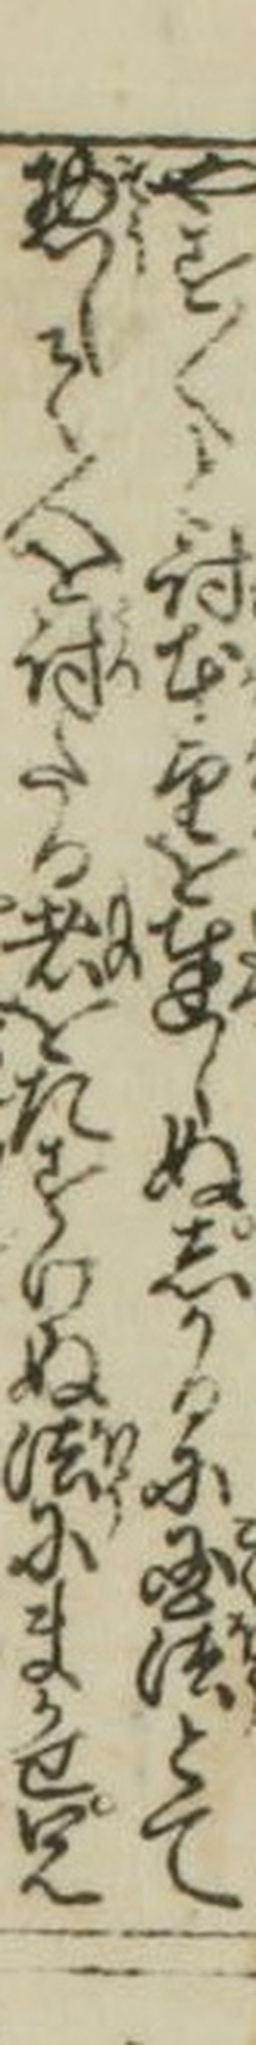惣して人を討たる者をたすけぬ法にまかせ。兄
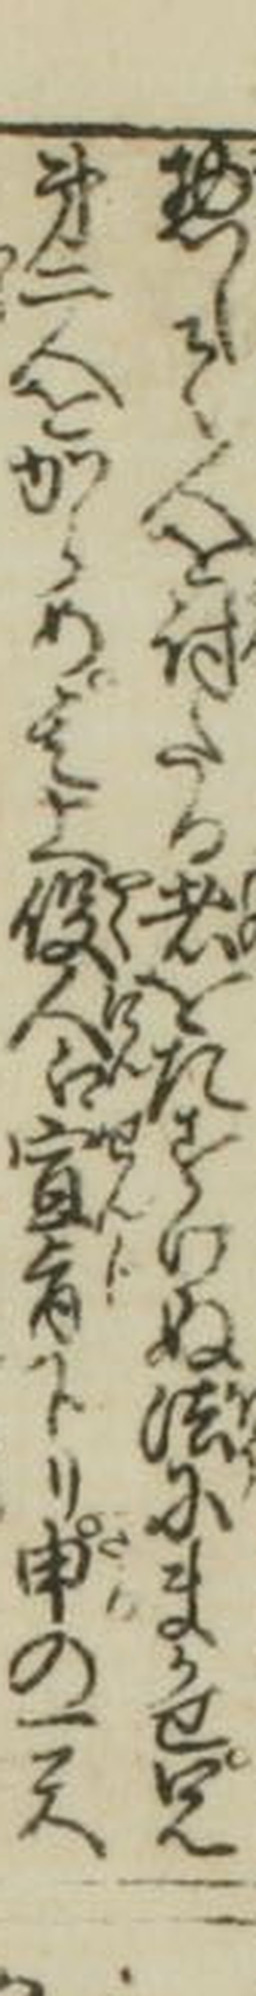弟二人をからめ。其上役人え宣旨下り。申の一天
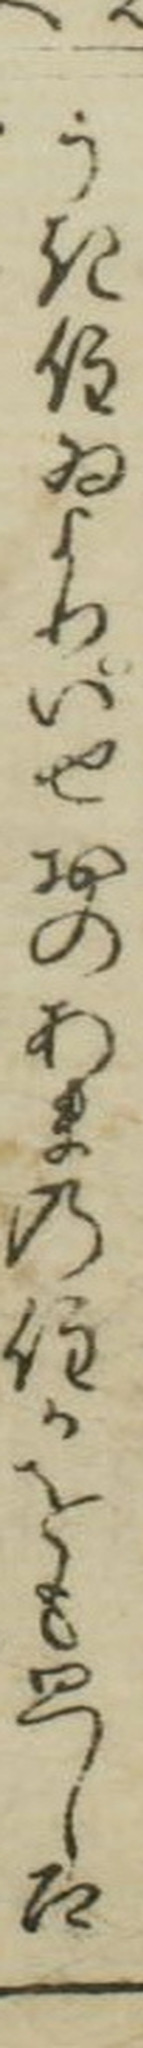うき住ゐより。いせおのあまの住かをも思し召
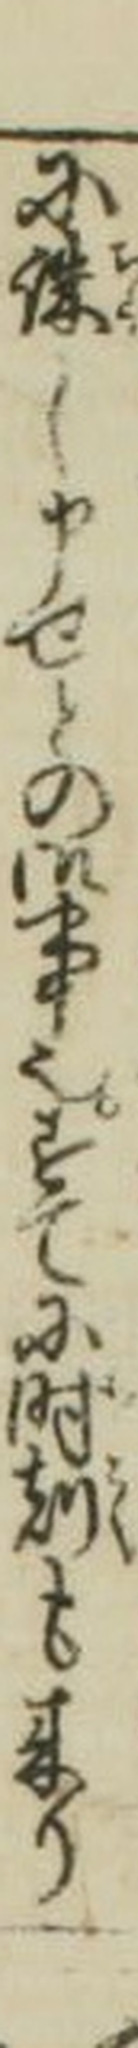に誅し申せとの御事也。すてに時刻も来り
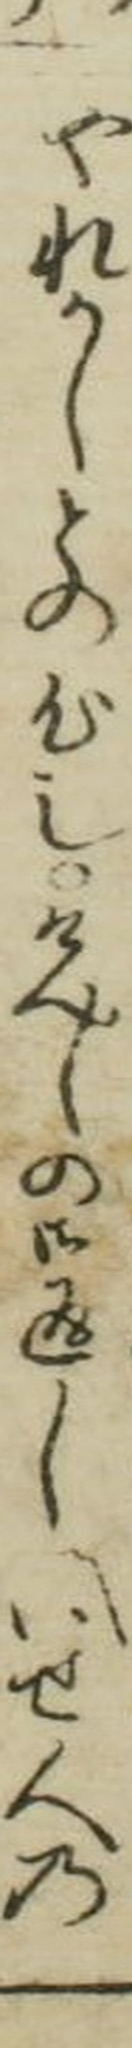やれかしとの心也。○けんしの御返し〽いせ人の
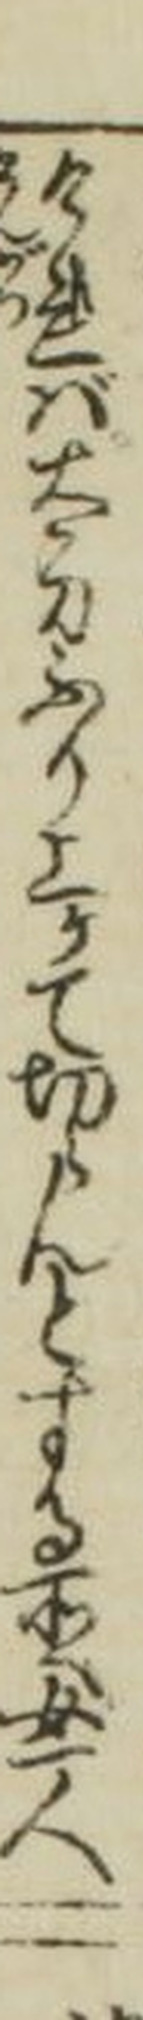ければ太刀ふり上けて切らんとする所へ女一人
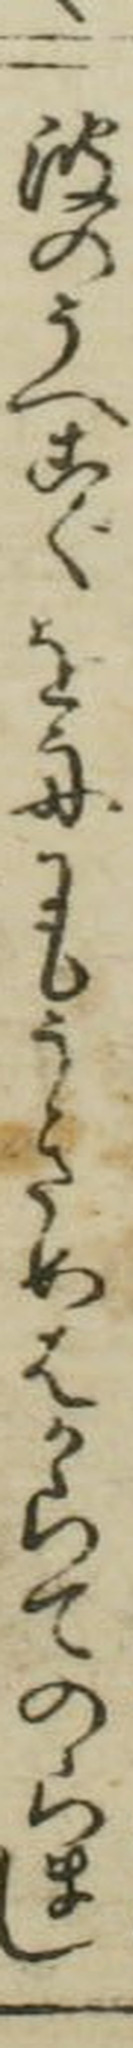波のうへこぐを舟にもうきめはからてのらまし
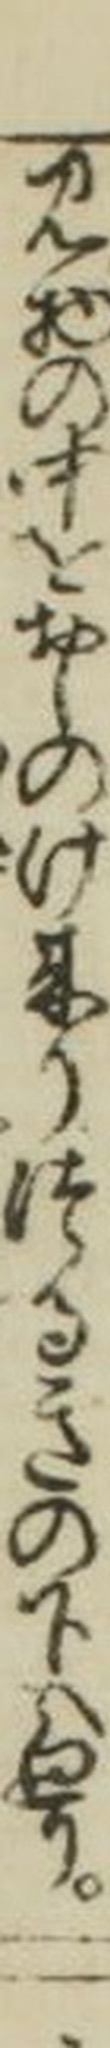見物の中をおしのけ来りつるきの下へ廻り。
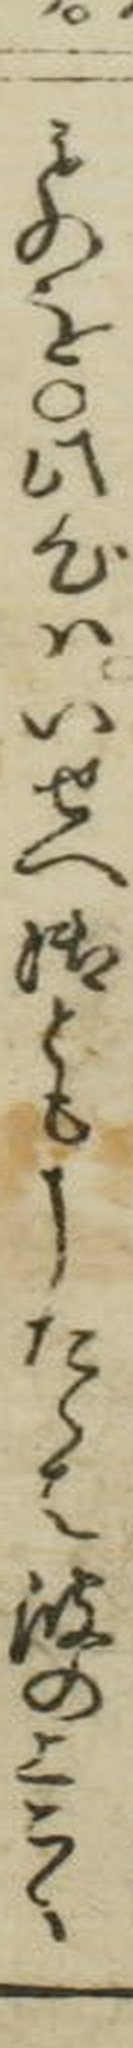ものを○此心は。いせへ御ともしたらは波の上こく
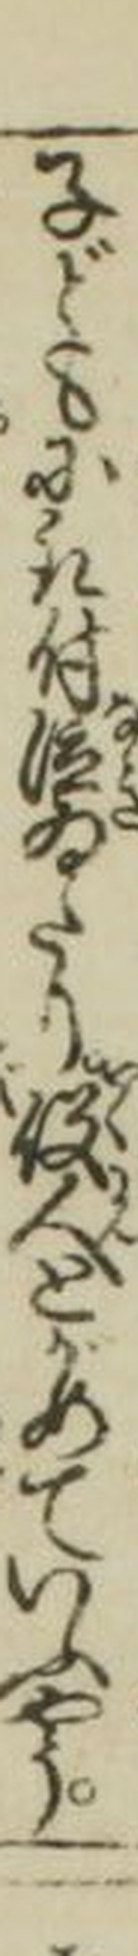子どもに取付泣ゐたり。役人とがめていふやう。
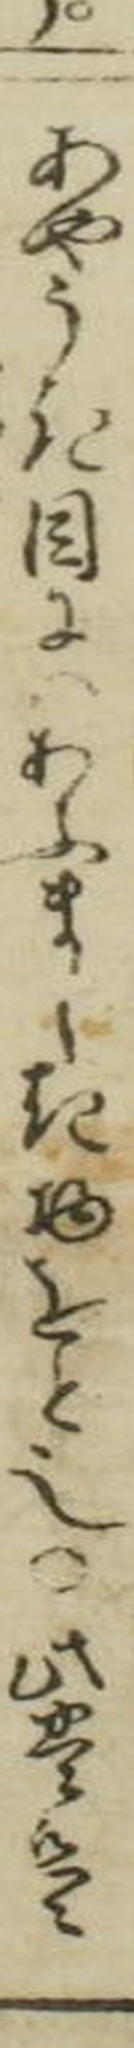あやうき目にはあふましき物をと也○此巻は
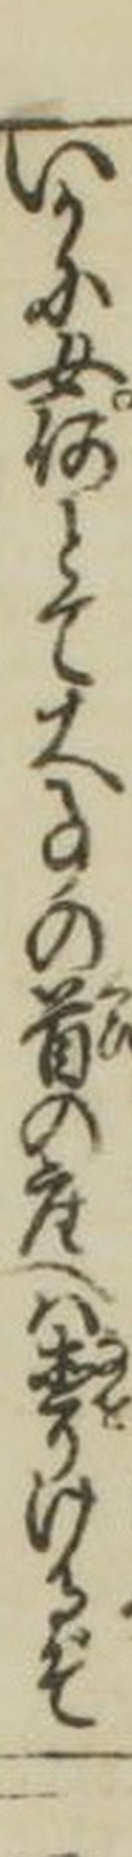いかに女。何とて大事の首の座へは直りけるぞ
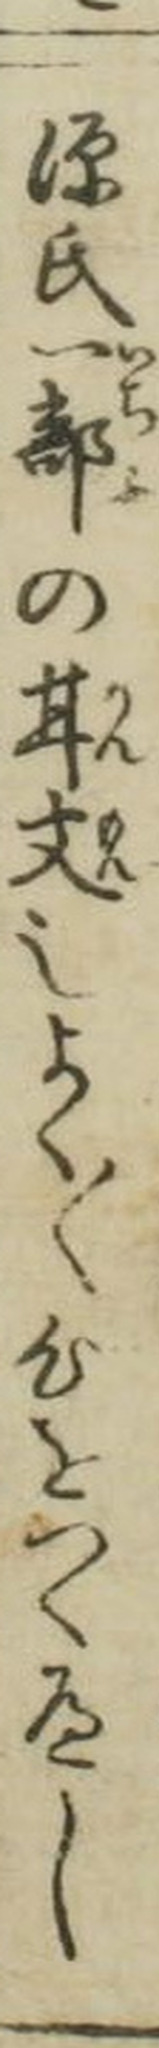源氏一部の文也よく〳〵心をつくへし
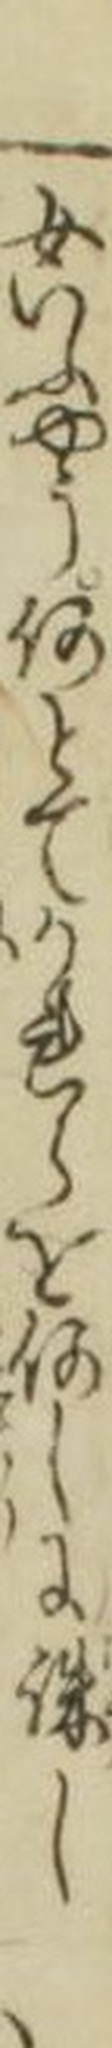女いふやう。何とてかれらを何しに誅し
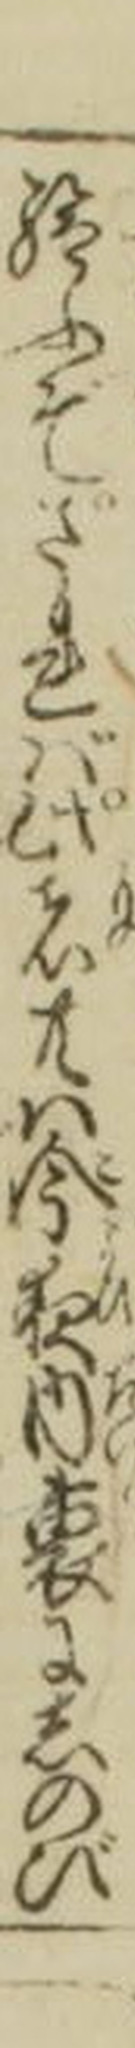給ふぞ。されば。此者共は今夜内裏にしのび
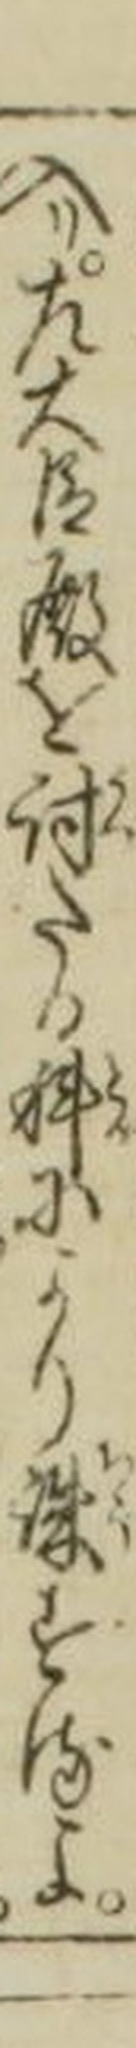入り。左大臣殿を討たる科により誅するよ。
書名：女源氏教訓鑑
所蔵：東京学芸大学附属図書館
